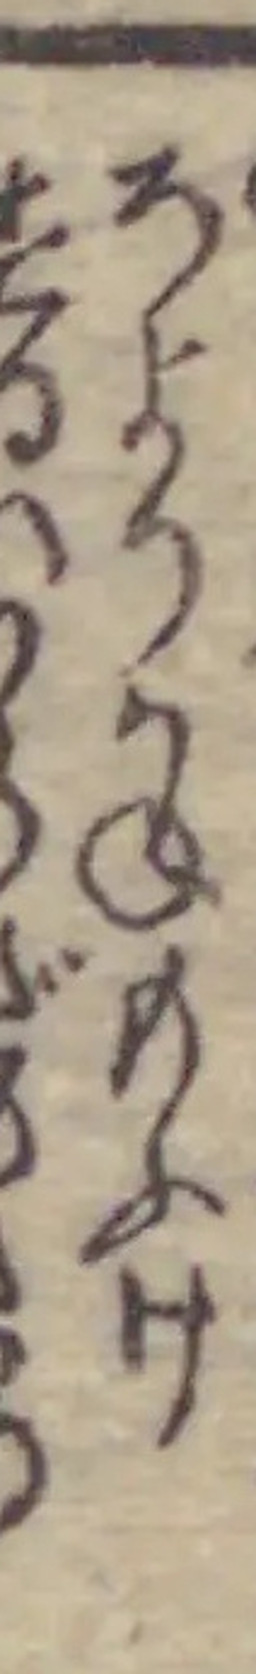するはからだのたつ
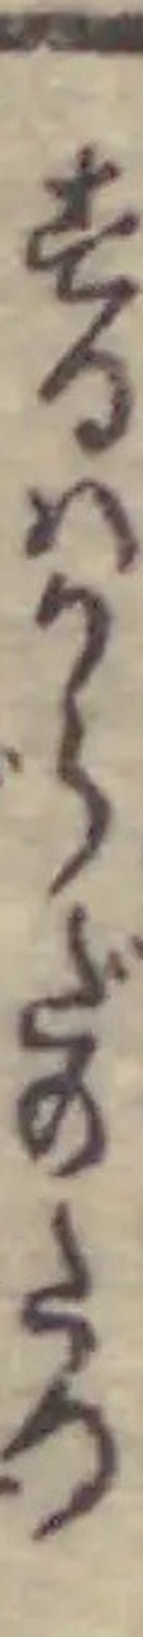するはからだのたつ
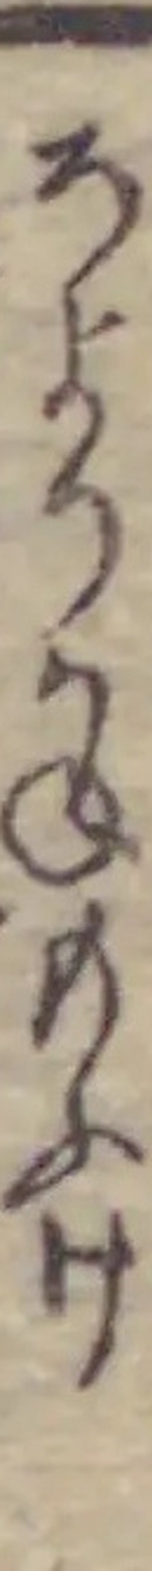ろよりかねもふけ
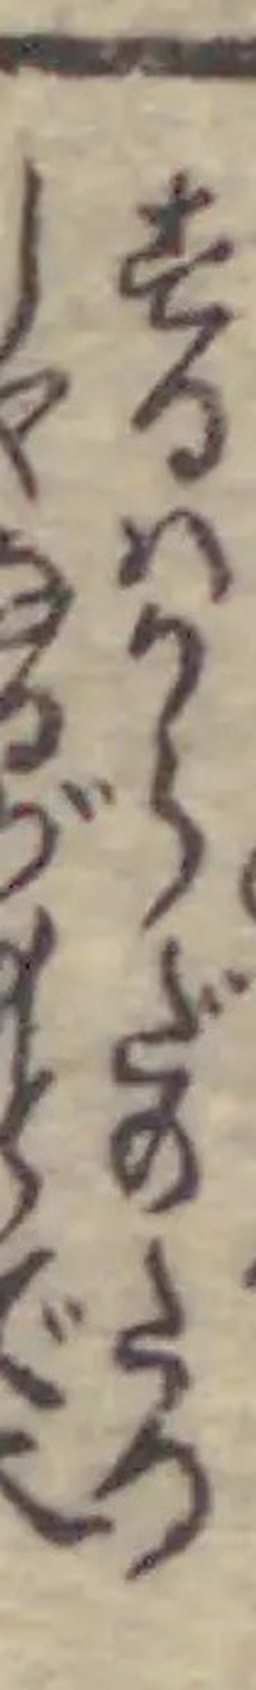しやなるがもとで也
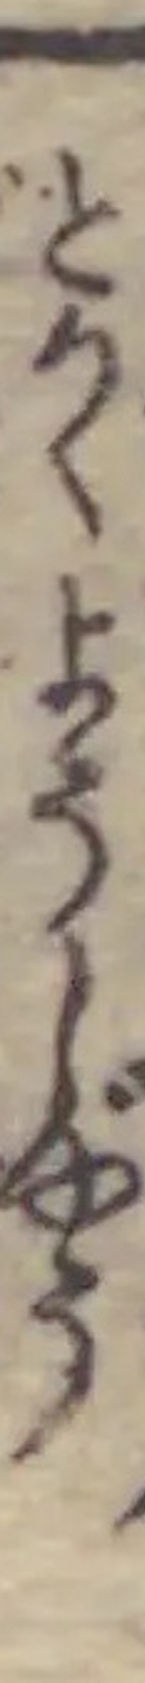とかくようじやう
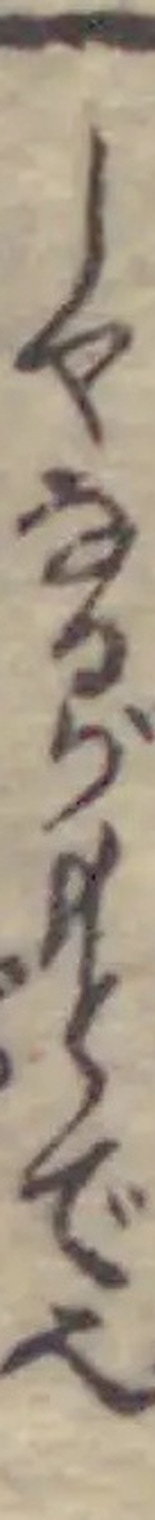しやなるがもとで也
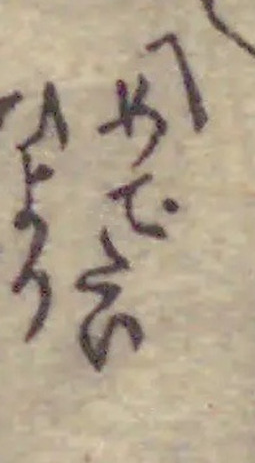〽めでたい
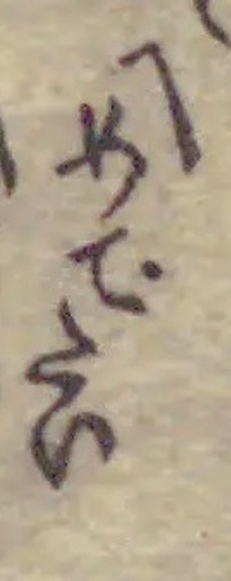〽めでたい
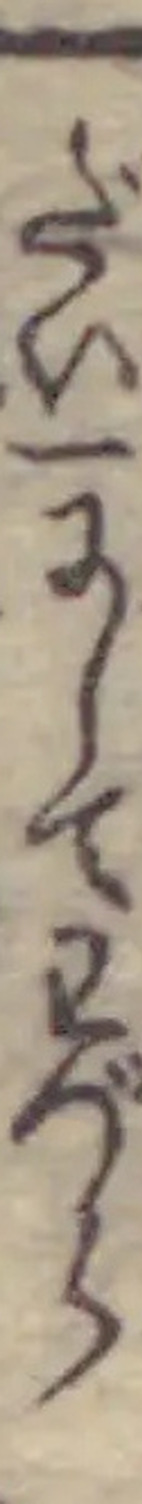だい一にしてわづら
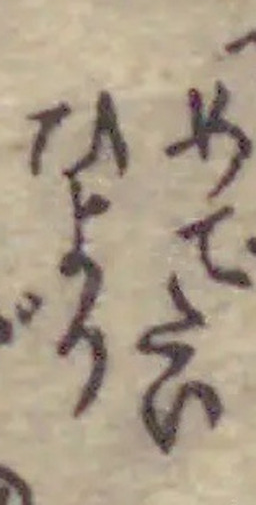ひより
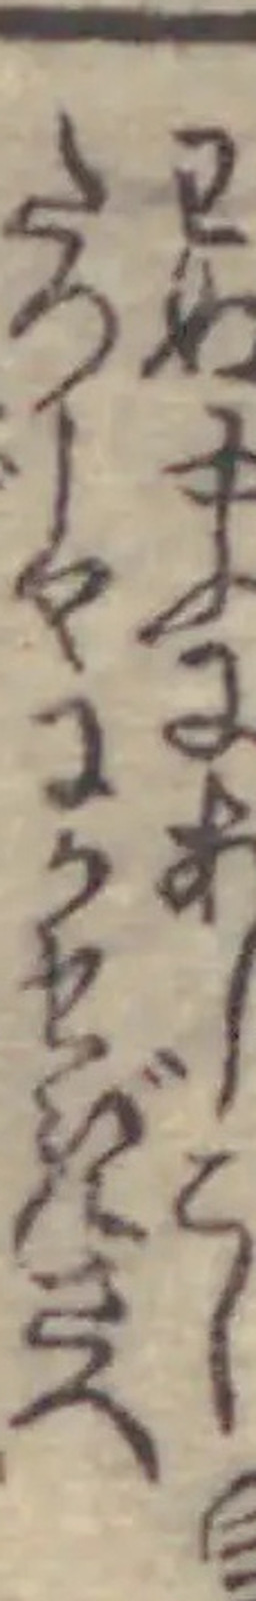たつしやにかせぎさへ
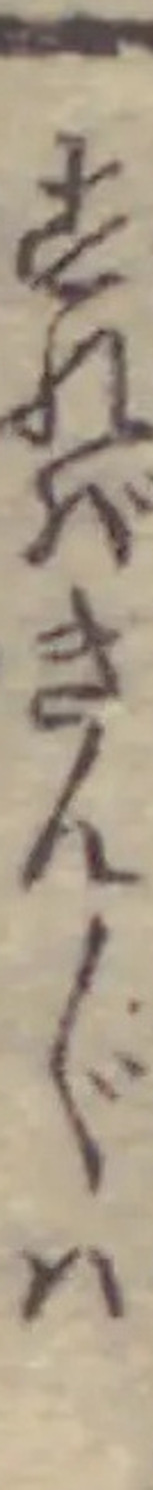すればきん〴〵は
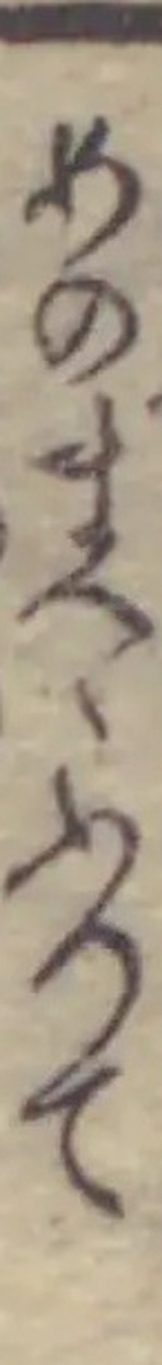めのまへゝふつて
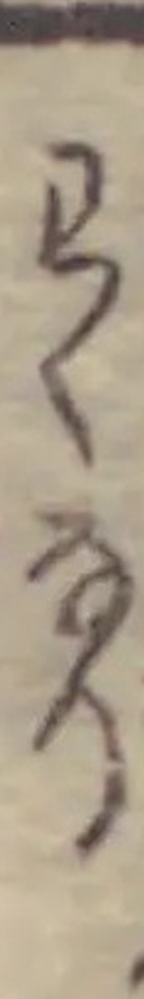わくなり
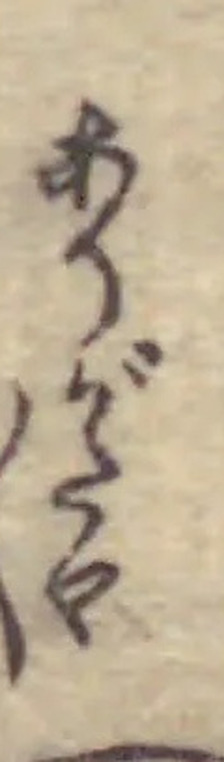ありがたや
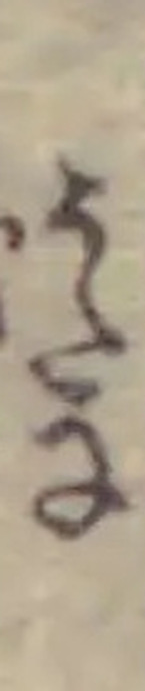うたに
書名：腹内養生主論 3巻
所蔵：国立国会図書館 National Diet Library, JAPAN
